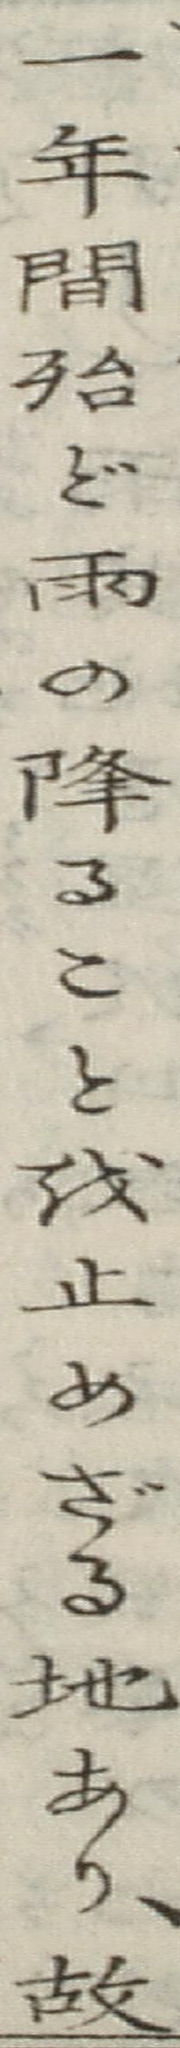一年間殆ど雨の降ることを止めざる地あり、故
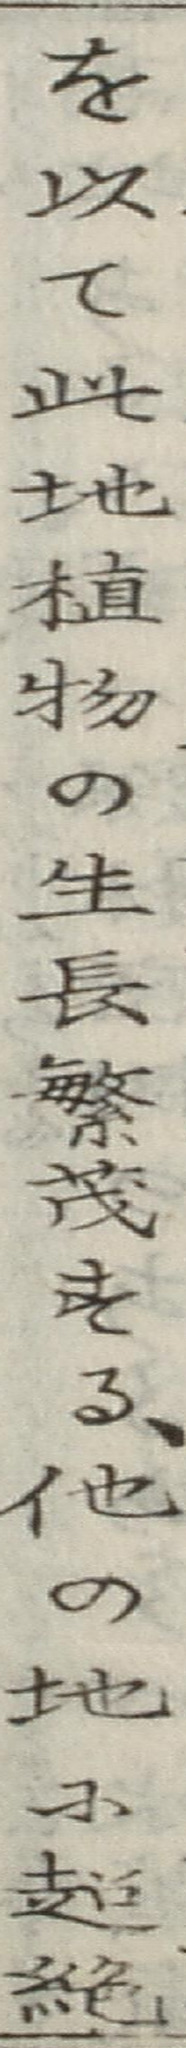を以て此地植物の生長繁茂する、他の地に超絶

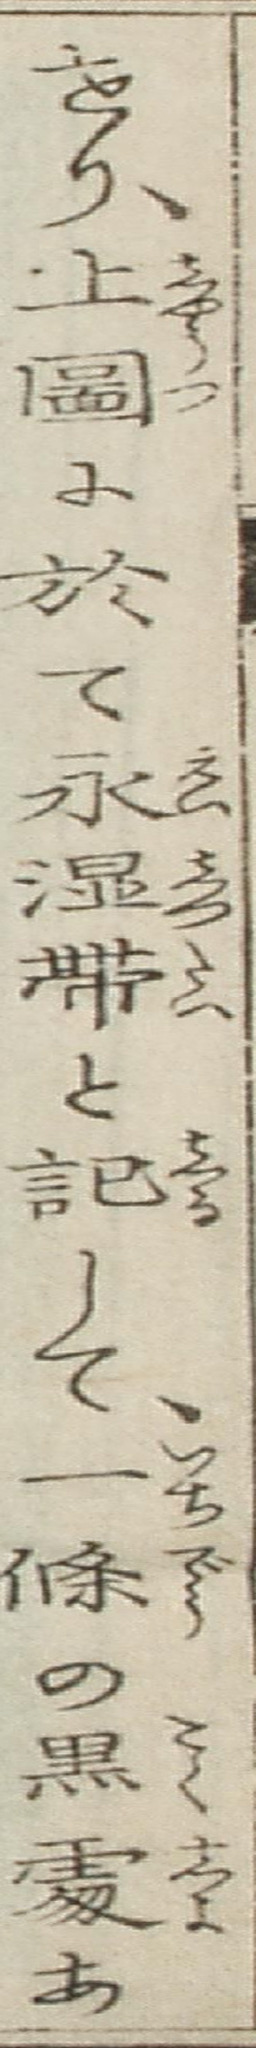せり、上図に於て永湿帯と記して、一条の黒処あ
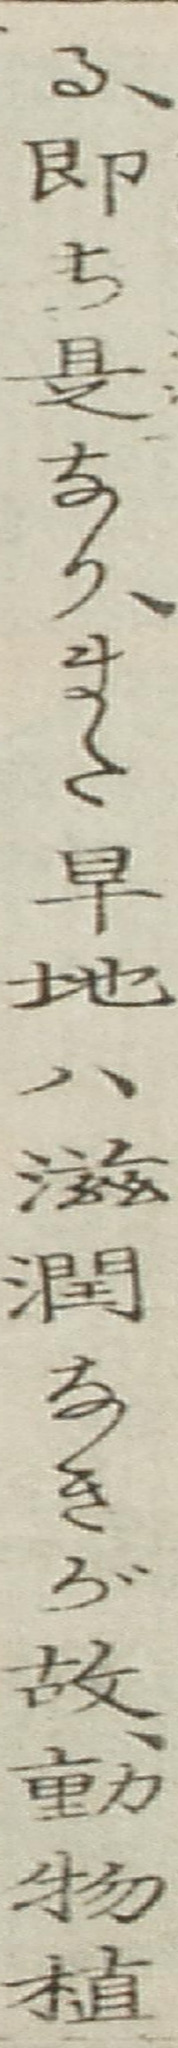る、即ち是なり、また旱地は滋潤なきが故、動物植
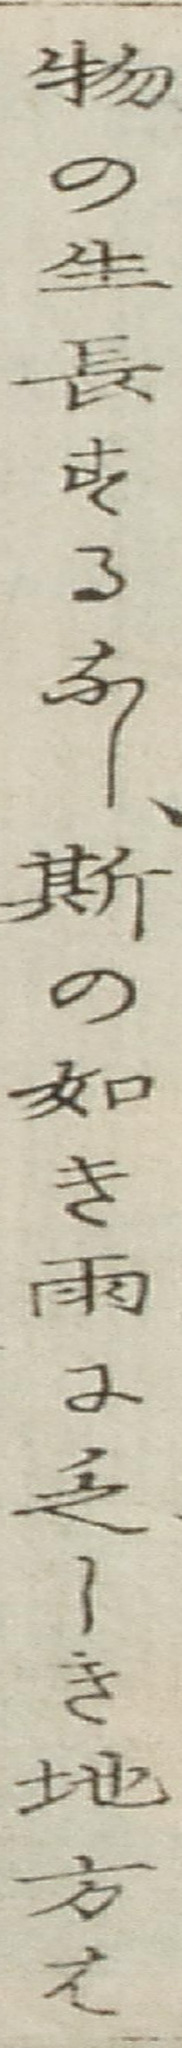物の生長するなし、斯の如き雨に乏しき地方は、
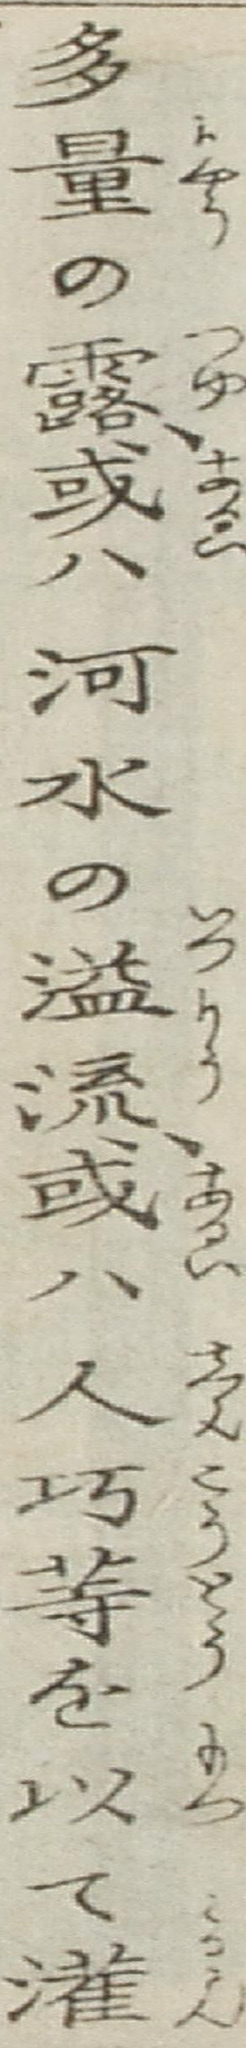多量の露、或は河水の溢流、或は人巧等を以て灌
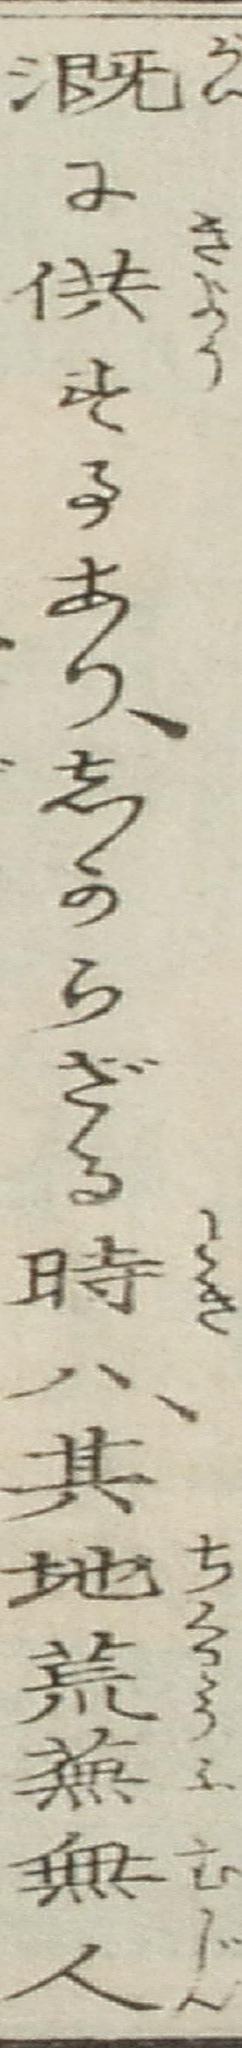漑に供するあり、しからざる時は、其地荒蕪無人
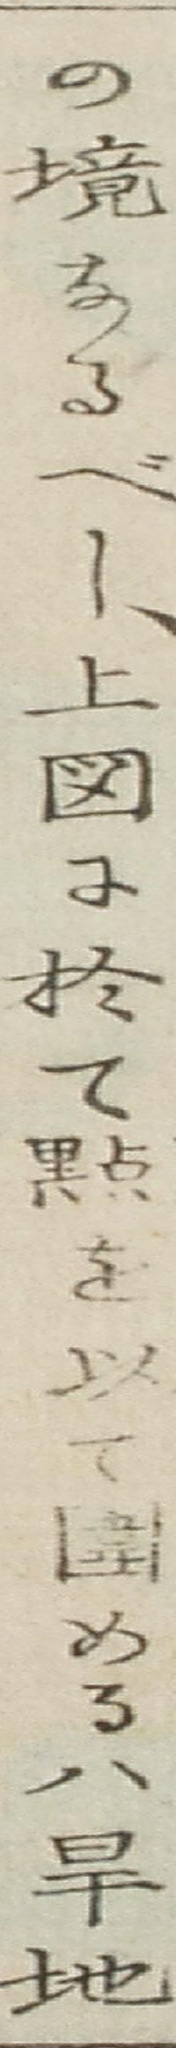の境なるべし、上図に於て点を以て囲めるは、旱地
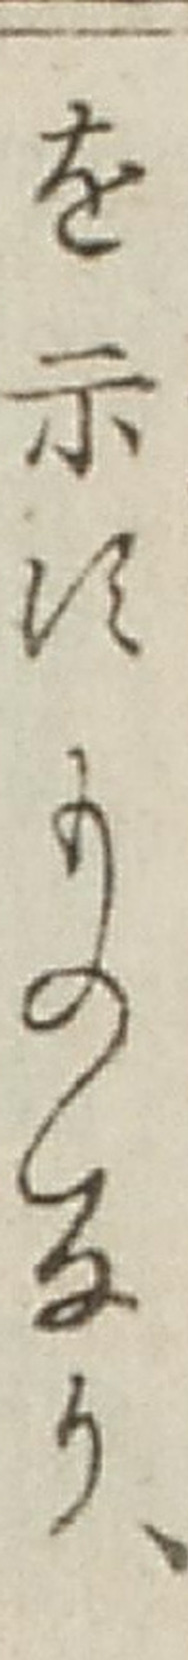を示すものなり、
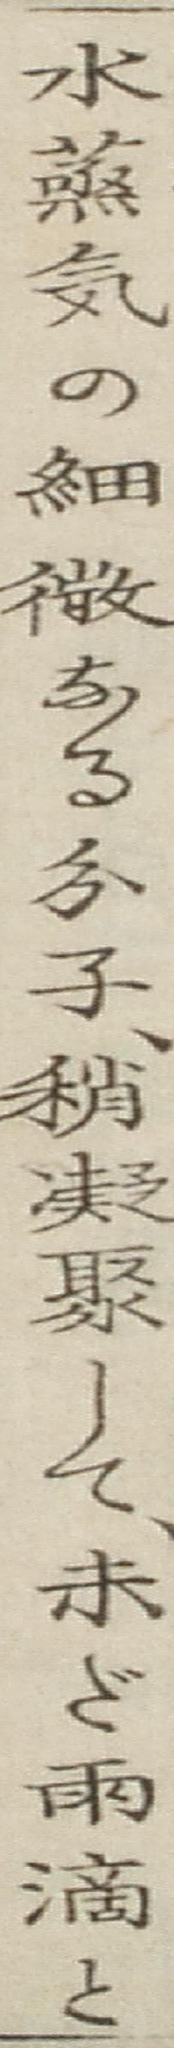水蒸気の細微なる分子、稍凝集して、未だ雨滴と
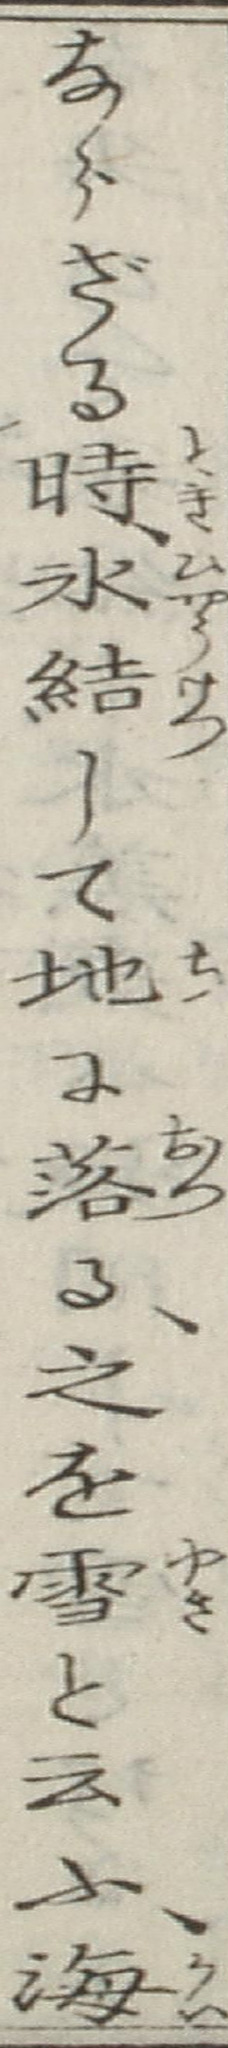ならざる時、氷結して地に落る、之を雪と云ふ、海
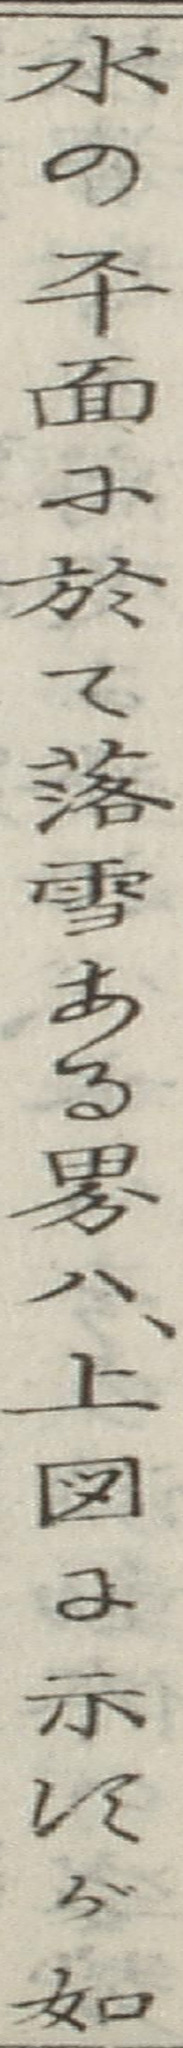水の平面に於て落雪ある界は、上図に示すが如
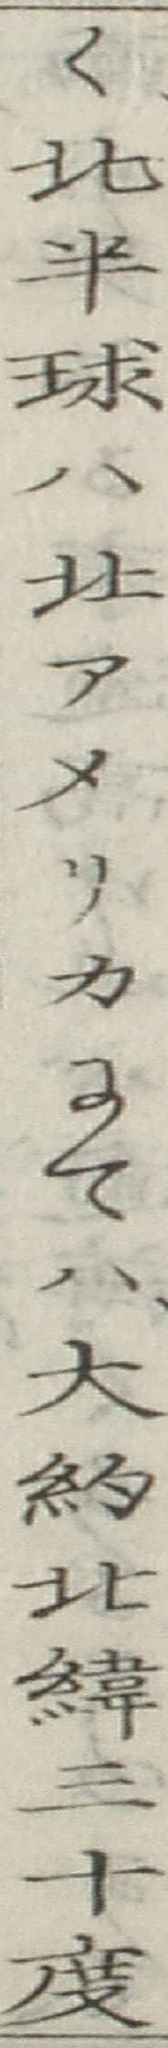く、北半球は北アメリカにては、大約北緯三十度
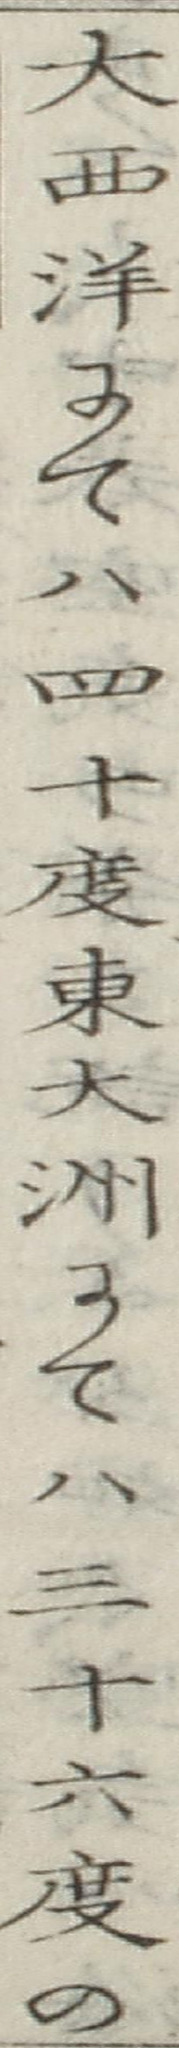大西洋にては四十度、東大洲にては三十六度の
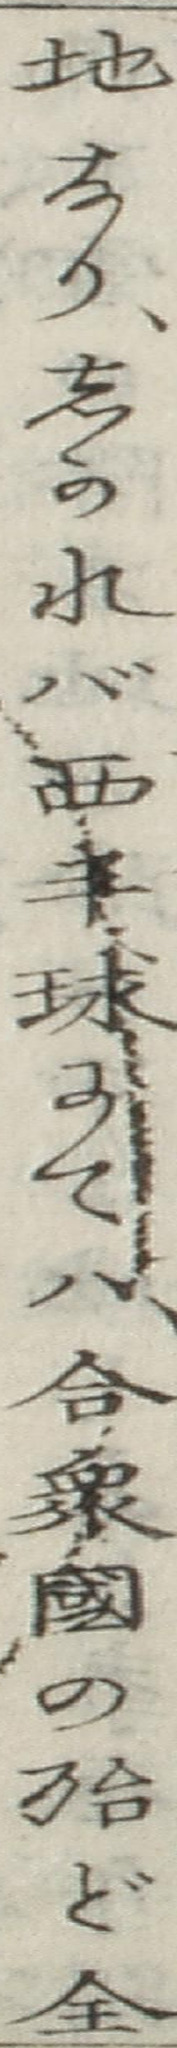地なり、しかれば、西半球にては、合衆国の殆ど全
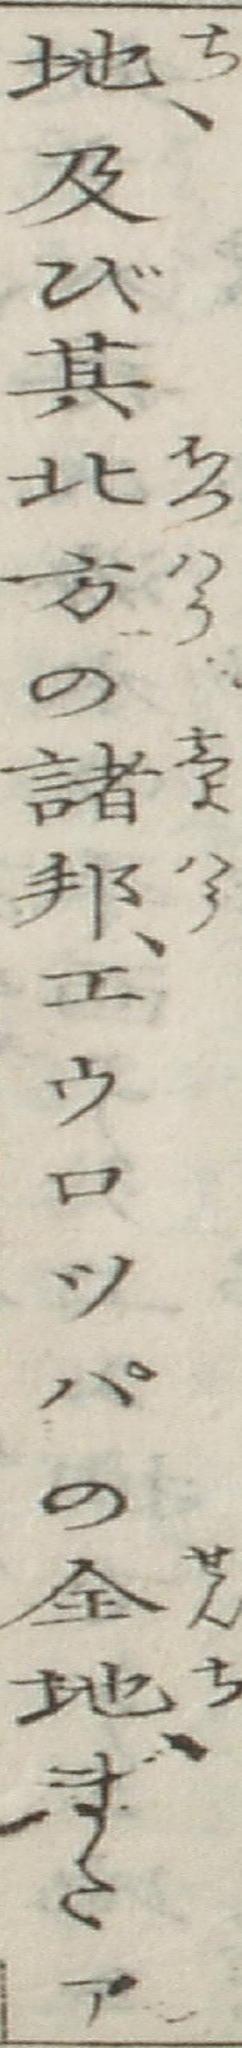地、及び其北方の諸邦、エウロツパの全地、またア
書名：訓蒙　天然地理學　下
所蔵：東京大学地震研究所図書室 Earthquake Research Institute Library, The University of Tokyo, JAPAN
